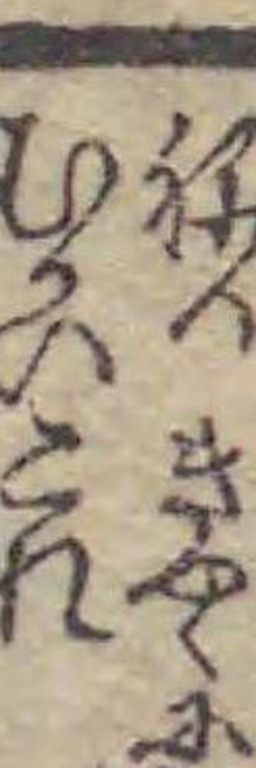むかいこれ
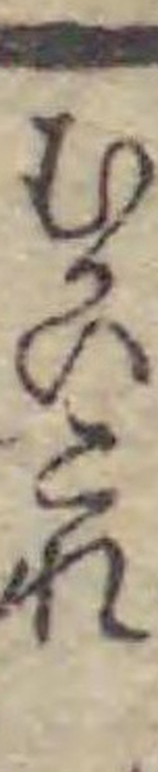むかいこれ
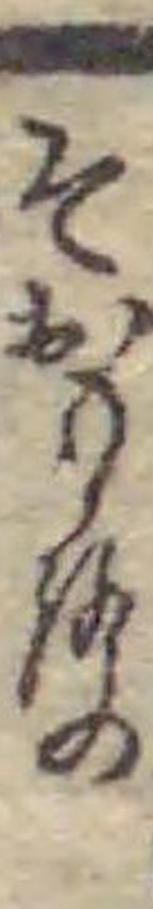そおもしろの
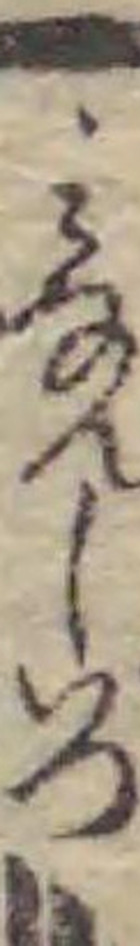みなんしいつ
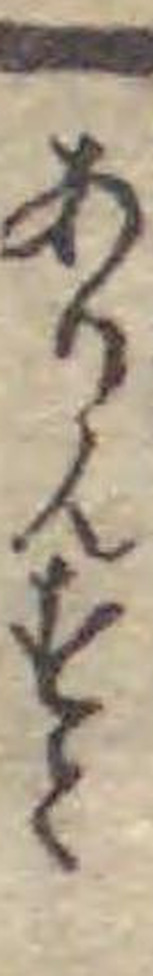ありんすと
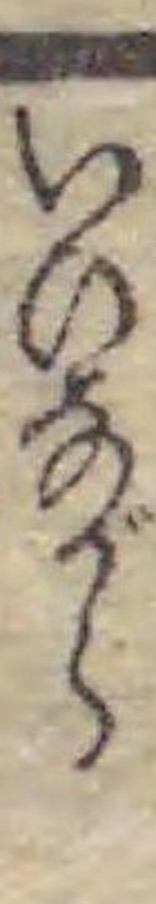いひながら
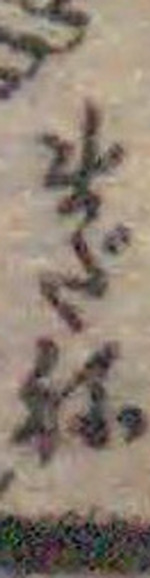まだね
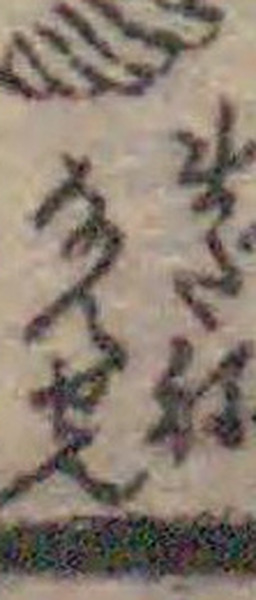なんせん
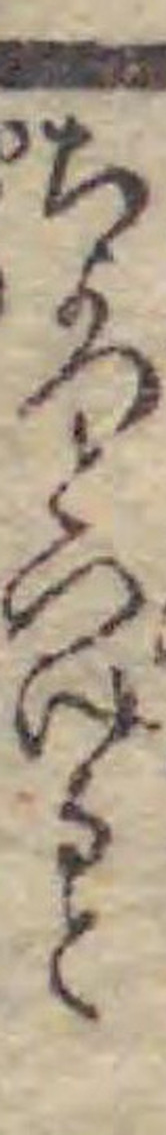ちよつとつけると
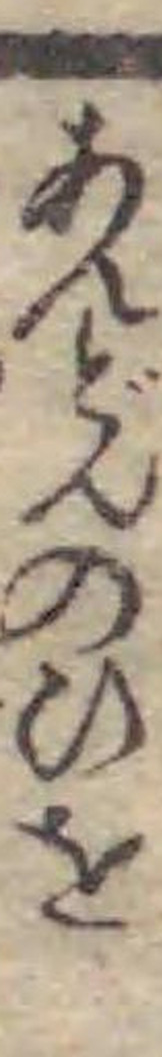あんどんのひを
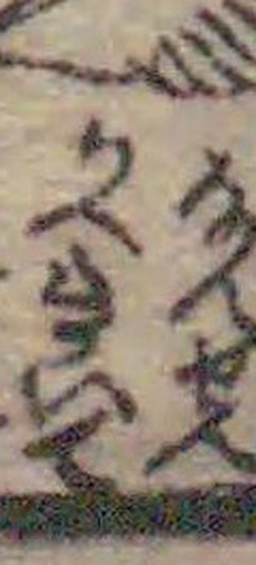かへまいて
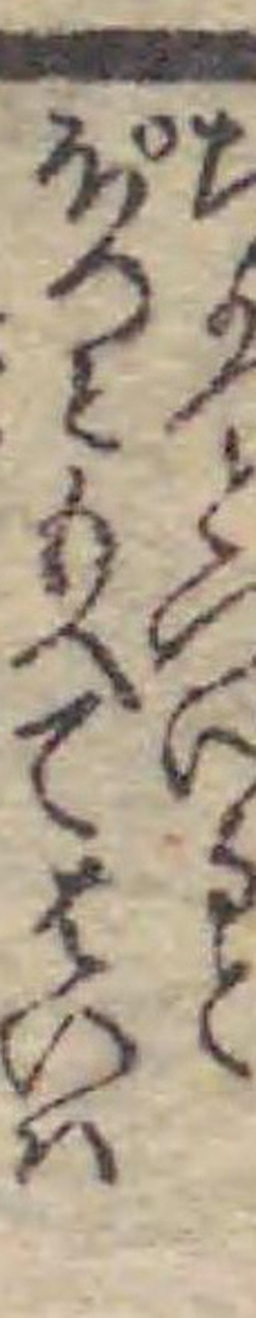ぽつともへてはいは
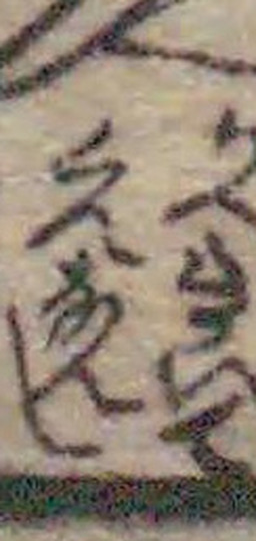くんなんし
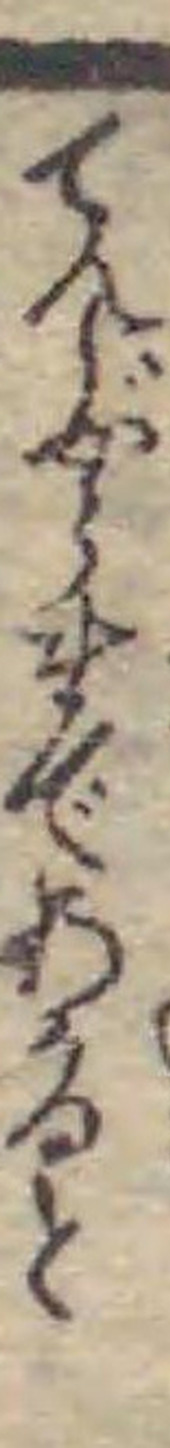てんじやうまであかると
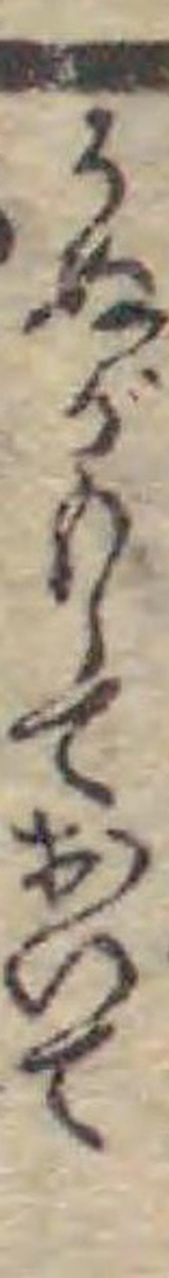うぬがもしておいて
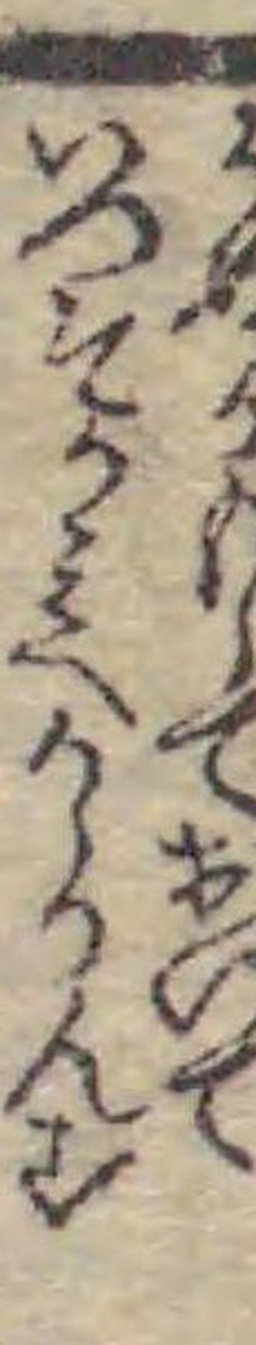いつそかみへかゝりんす
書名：紙屑身上噺 : 3巻
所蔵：国立国会図書館 National Diet Library, JAPAN
